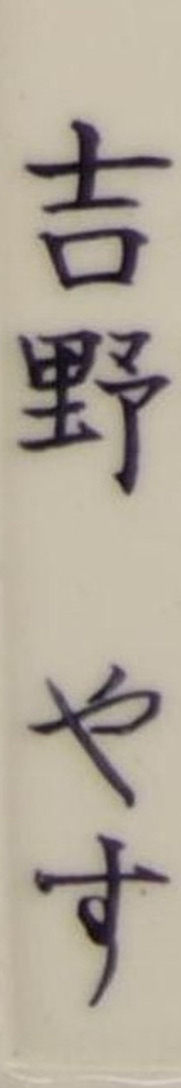吉野やす

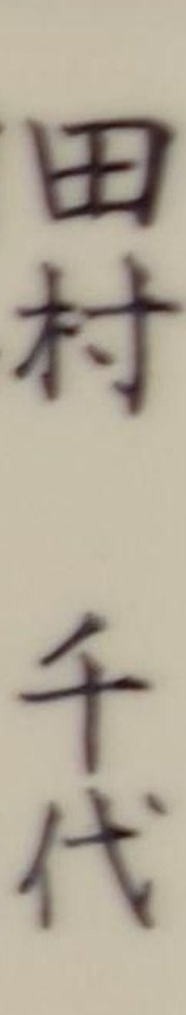田村千代
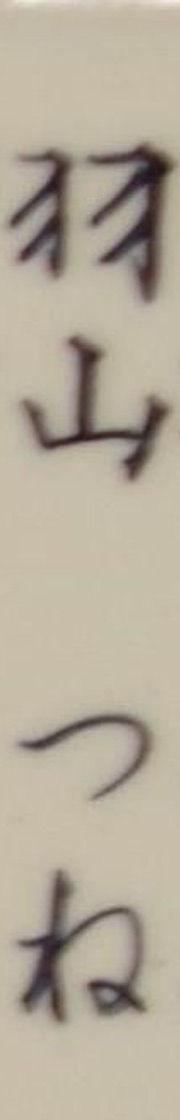羽山つね
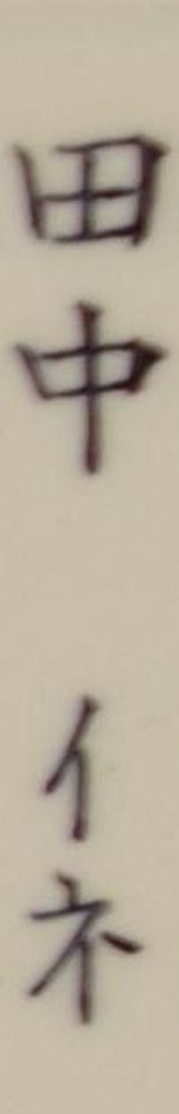田中イネ
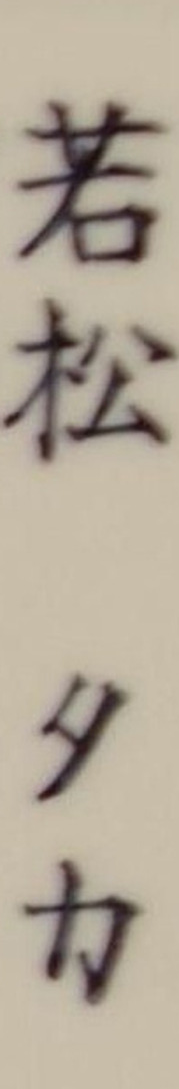若松タカ
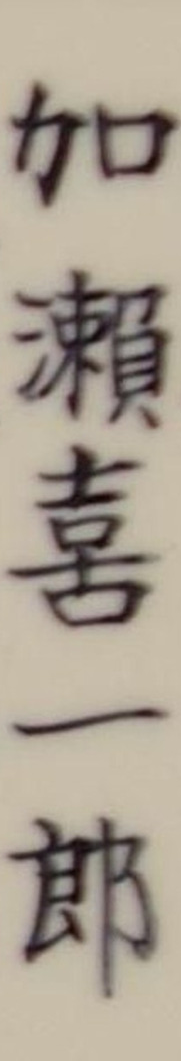加瀬喜一郎
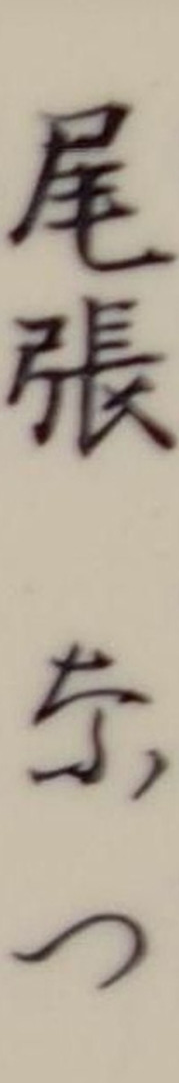尾張なつ
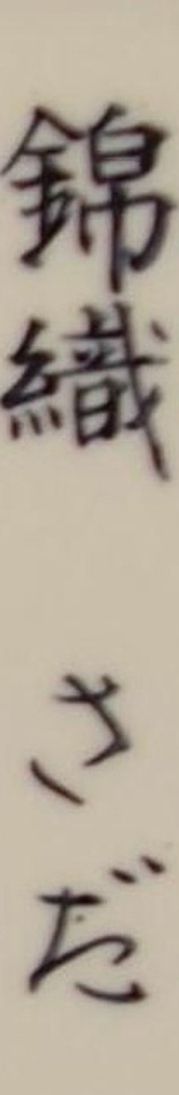錦織さだ
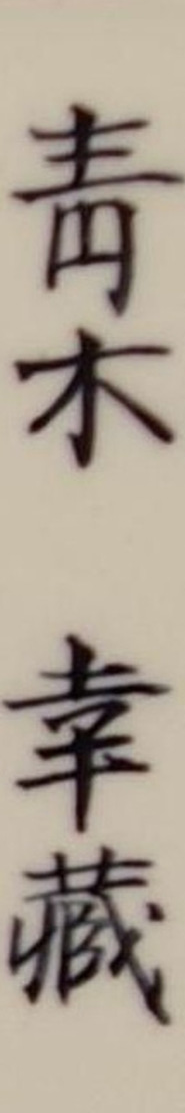青木幸蔵
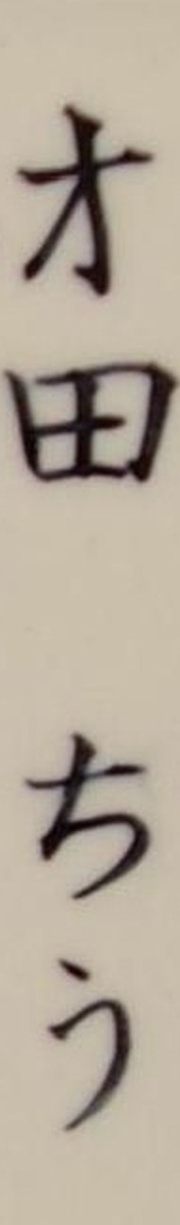才田ちう
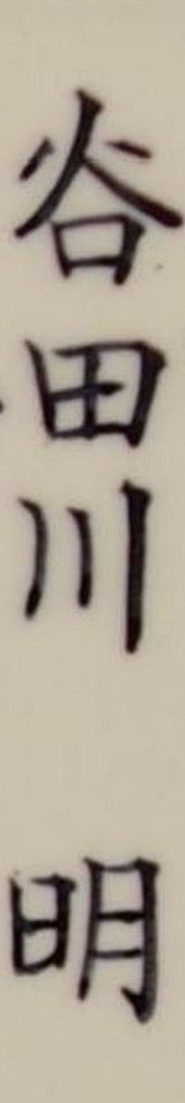谷田川明
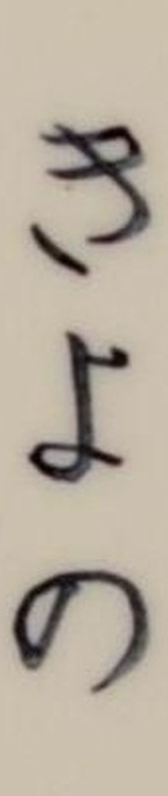きよの
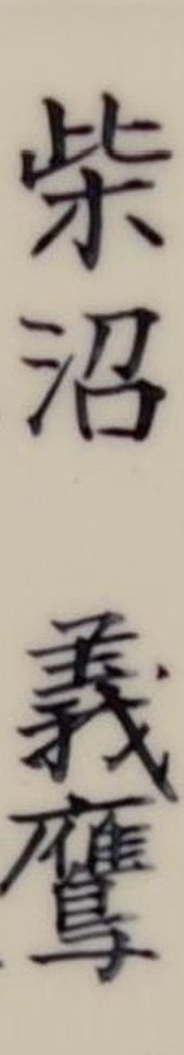柴沼義鷹
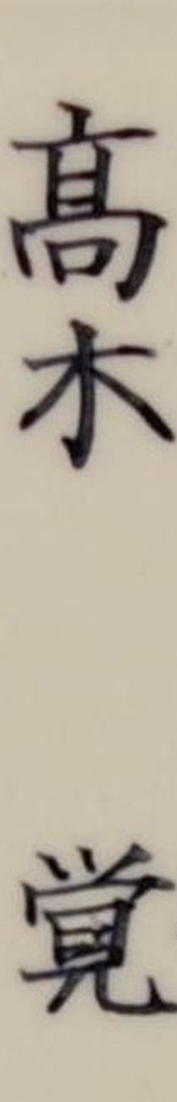高木覚
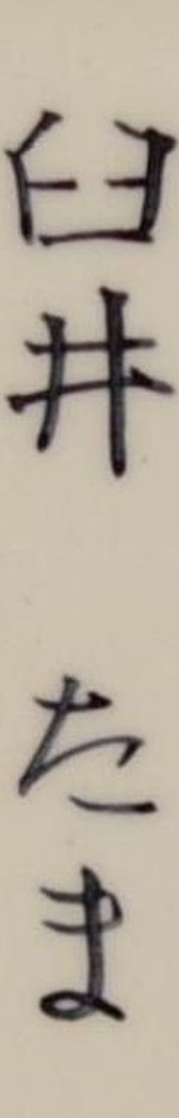臼井たま
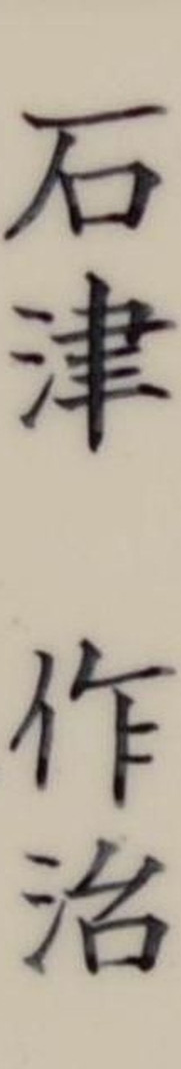石津作治
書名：M~S
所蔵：高野山金剛峯寺
